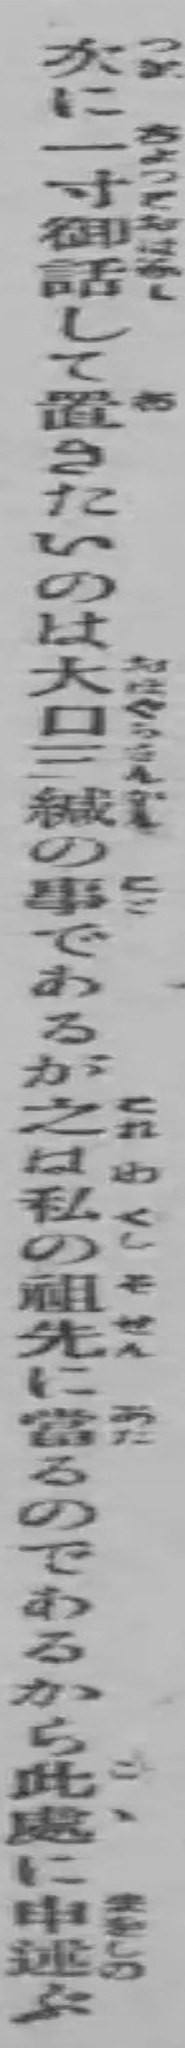大口三緘次に一寸御話して置きたいのは大口三緘の事であるが之は私の祖先に当るのであるから此処に申述ぶ
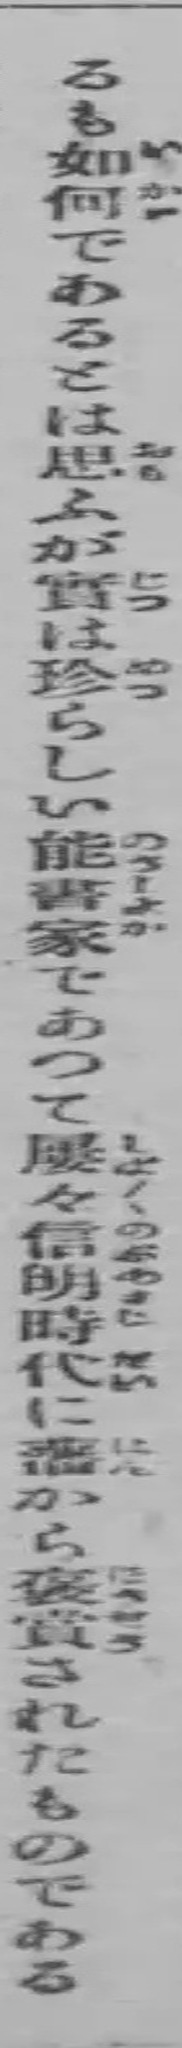るも如何であるとは思ふが実は珍らしい能書家であつて屡々信明時代に藩から褒賞されたものである
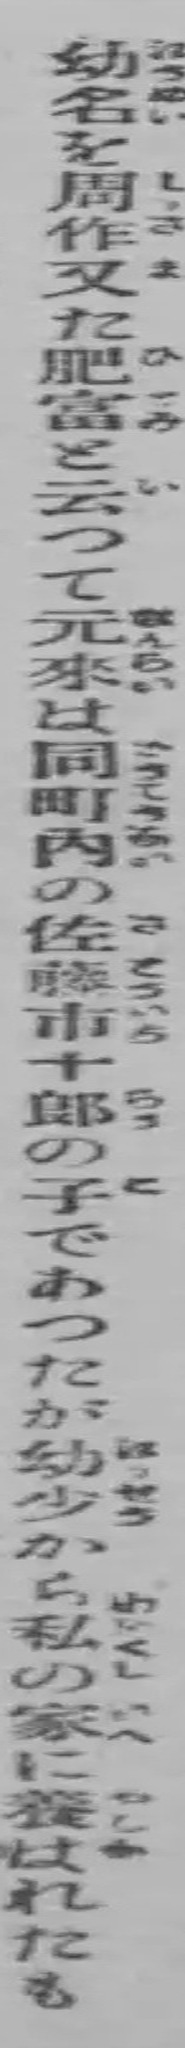幼名を周作又た肥富と云つて元来は同町内の佐藤市十郎の子であつたが幼少から私の家に養はれたも
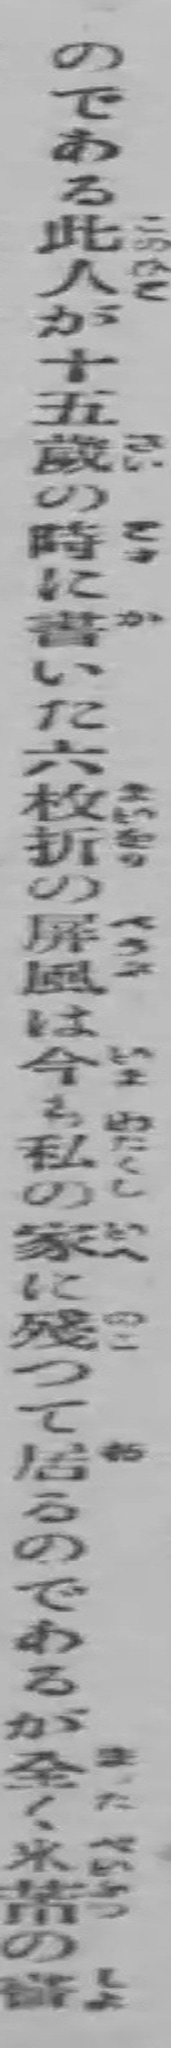のである此人が十五歳の時に書いた六枚折の屏風は今も私の家に残つて居るのであるが全く米芾の書
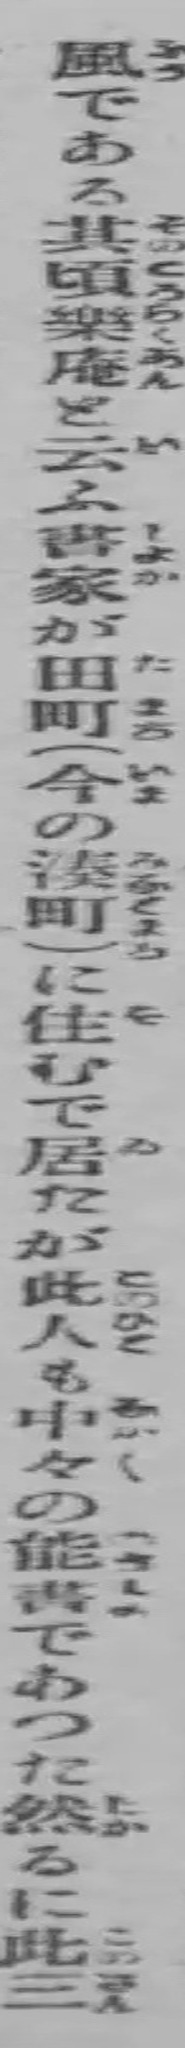風である其頃楽庵と云ふ書家が田町(今の湊町)に住むで居たが此人も中々の能書であつた然るに此三
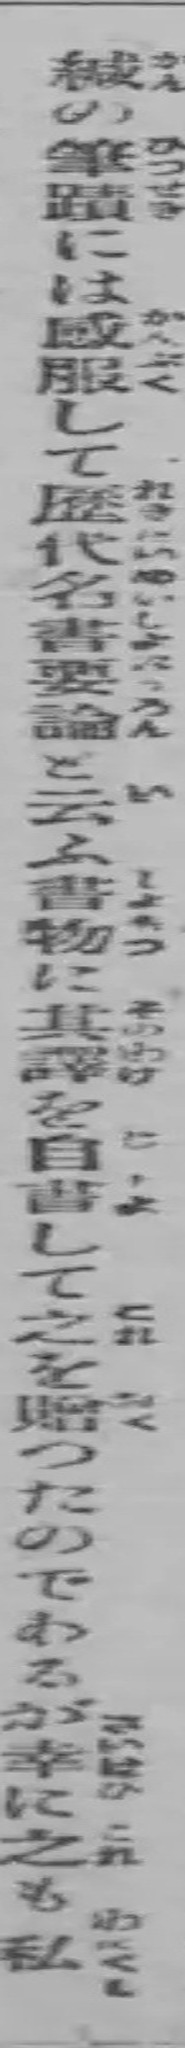緘の筆蹟には感服して歴代名書要論と云ふ書物に其訳を自書して之を贈つたのであるが幸に之も私
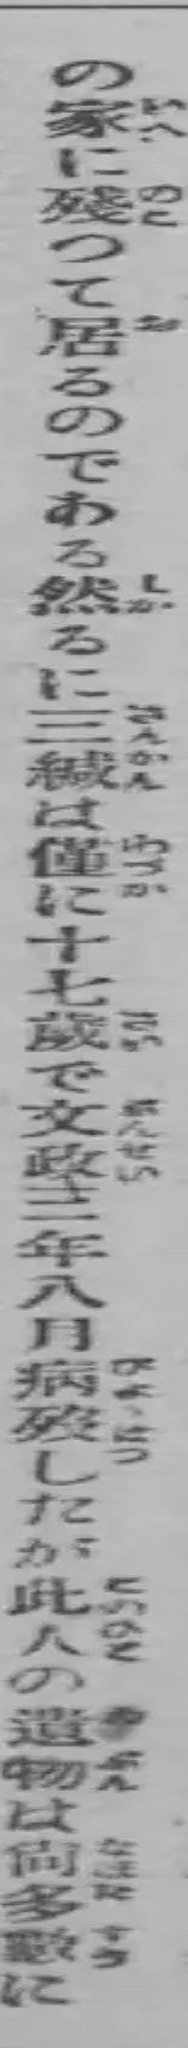の家に残つて居るのである然るに三緘は僅に十七歳で文政三年八月病歿したが此人の遺物は尚多数に
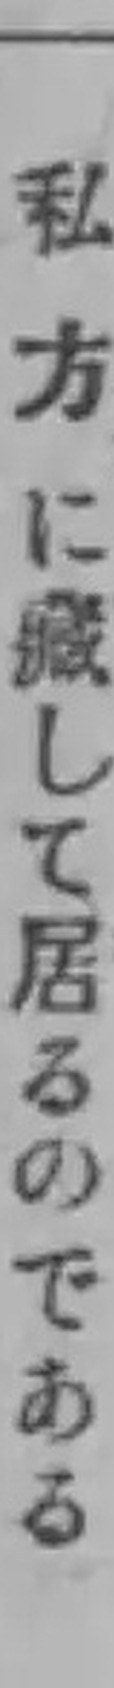私方に蔵して居るのである

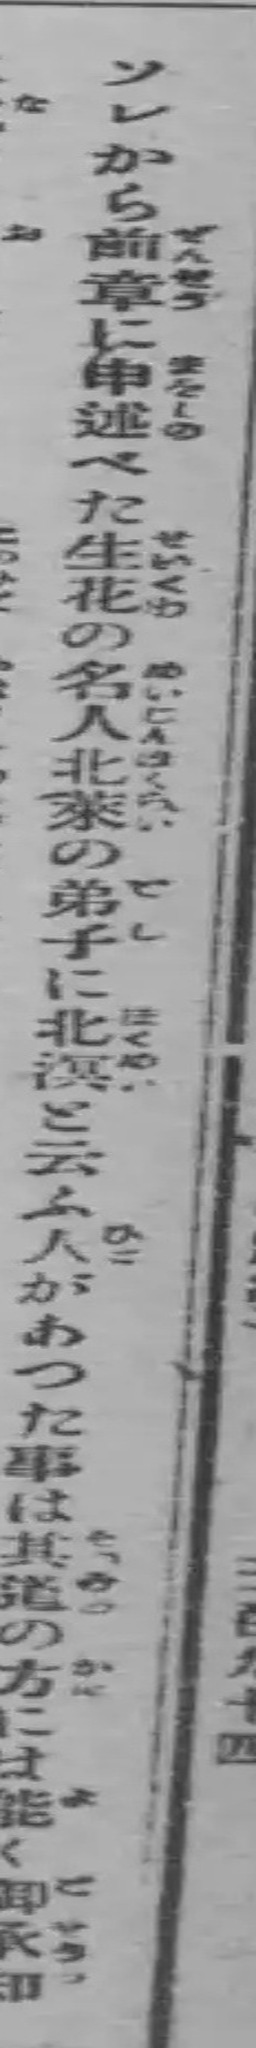四時庵北溟ソレから前章に申述べた生花の名人北萊の弟子に北溟と云ふ人があつた事は其道の方には能く御承知
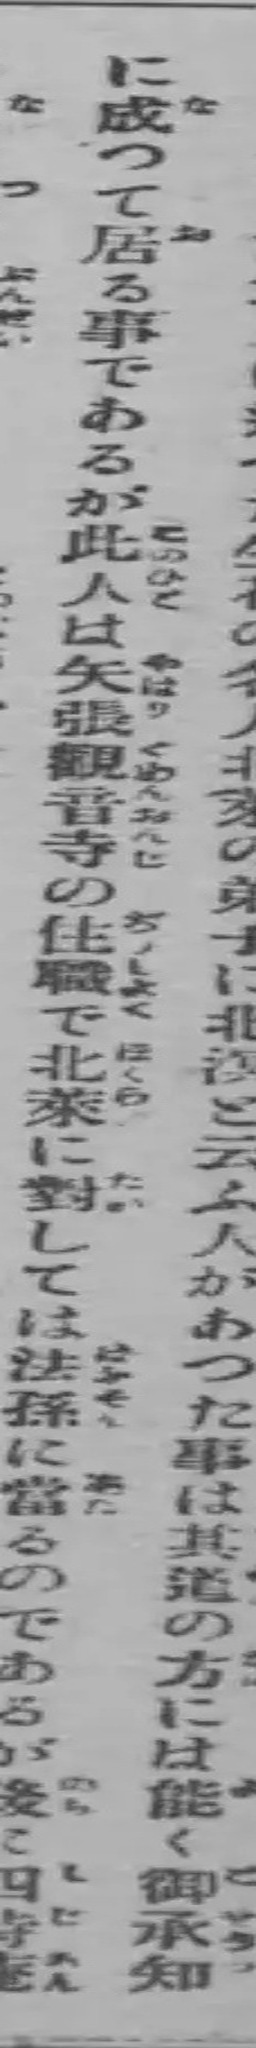に成つて居る事であるが此人は矢張観音寺の住職で北萊に対しては法孫に当るのであるが後に四時庵
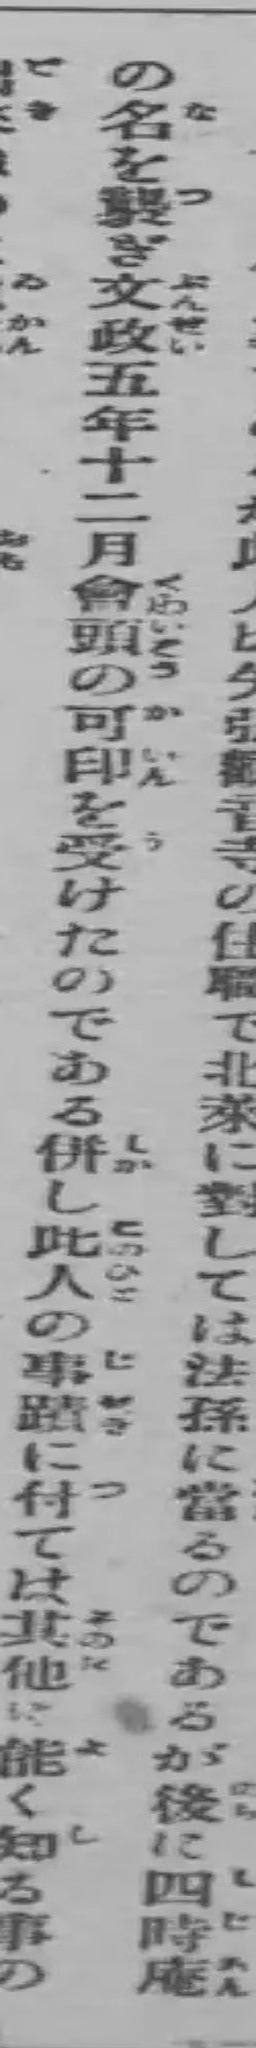の名を襲ぎ文政五年十二月会頭の可印を受けたのである併し此人の事蹟に付ては其他に能く知る事の
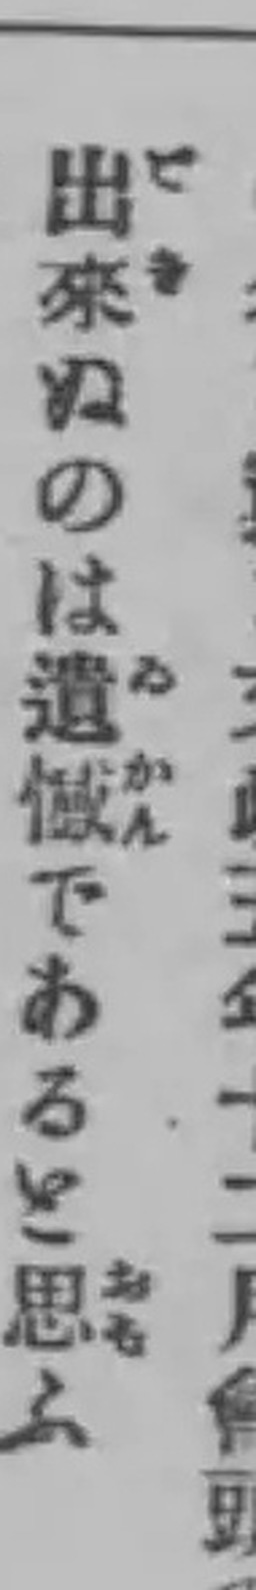出来ぬのは遺憾であると思ふ
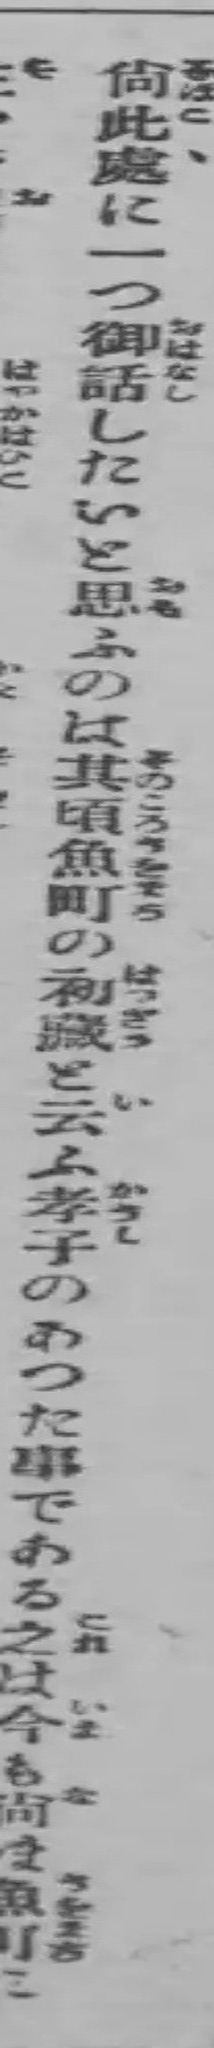孝子初蔵尚此処に一つ御話したいと思ふのは其頃魚町の初蔵と云ふ孝子のあつた事である之は今も尚ほ魚町に
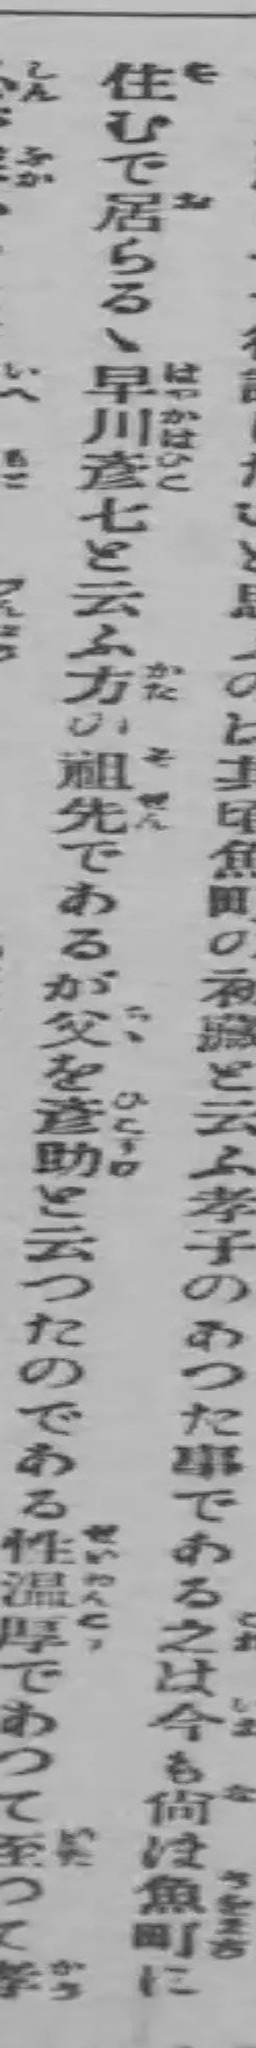住むで居らるゝ早川彦七と云ふ方の祖先であるが父を彦助と云つたのである性温厚であつて至つて孝
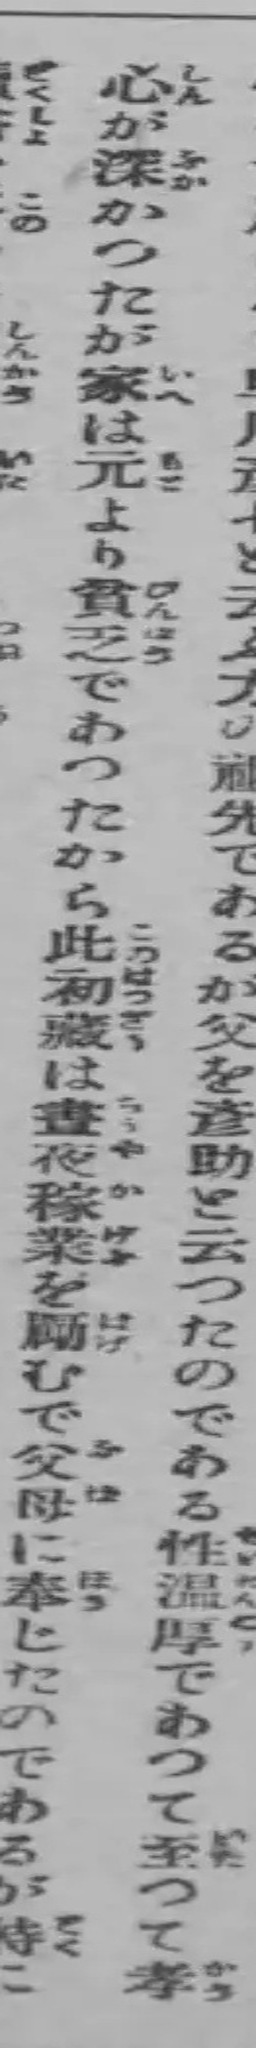心が深かつたが家は元より貧乏であつたから此初蔵は昼夜稼業を励むで父母に奉じたのであるが特に
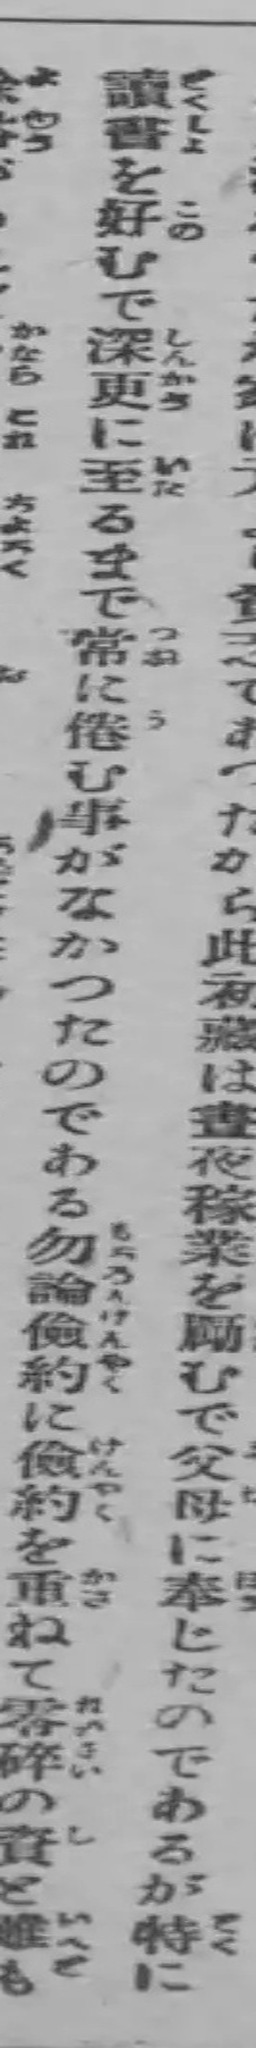読書を好むで深更に至るまで常に倦む事がなかつたのである勿論倹約に倹約を重ねて零砕の資と雖も
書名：豊橋市史談
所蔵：国立国会図書館 National Diet Library, JAPAN
